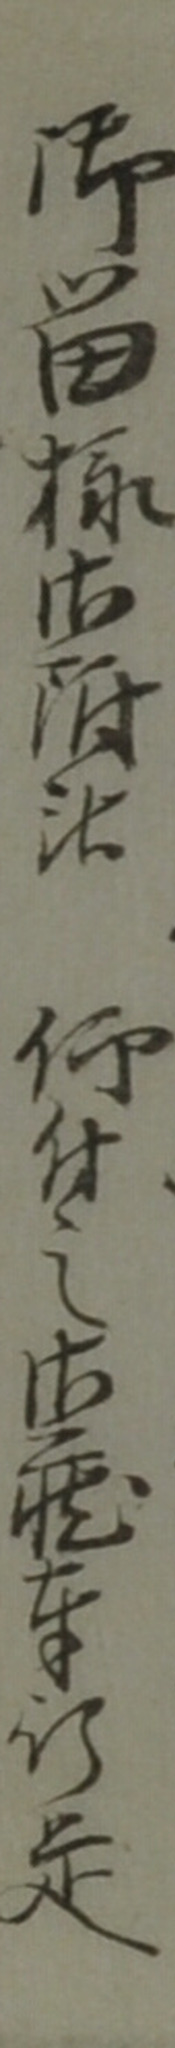御留様御附被仰付之御蔵奉行是
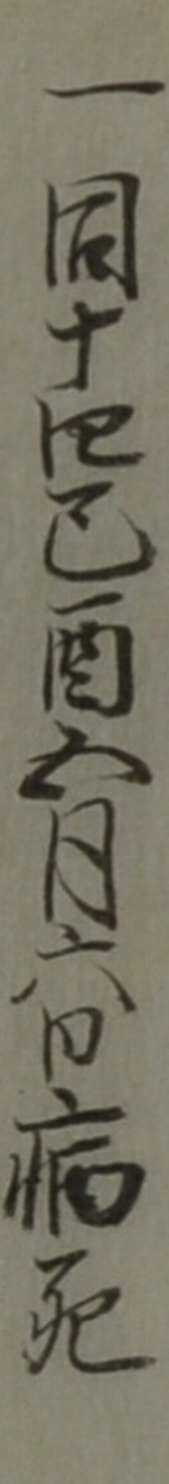一同十四己酉五月六日病死
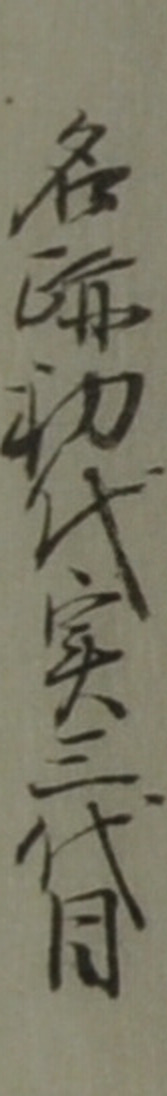名跡初代実三代目
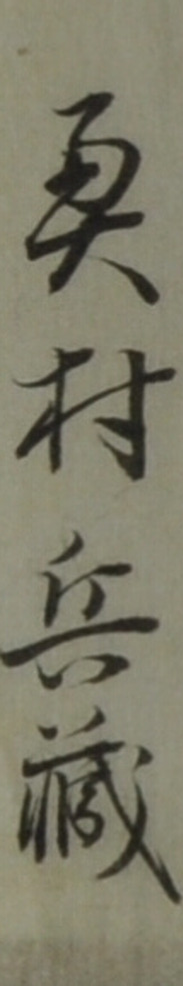奥村兵蔵

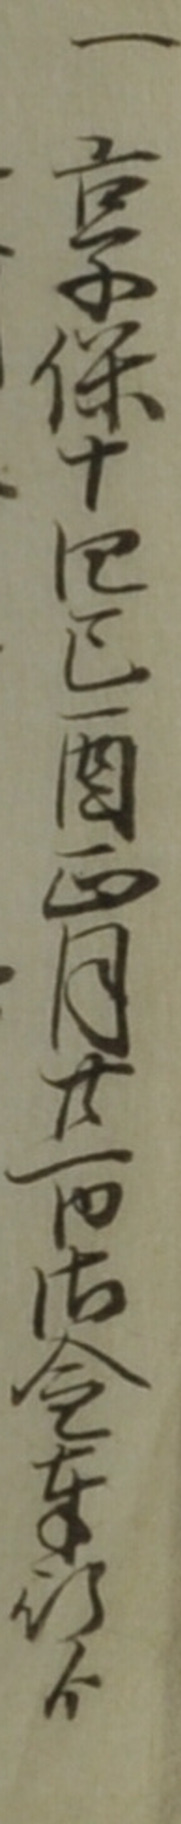一享保十四己酉正月廿一日御金奉行ゟ
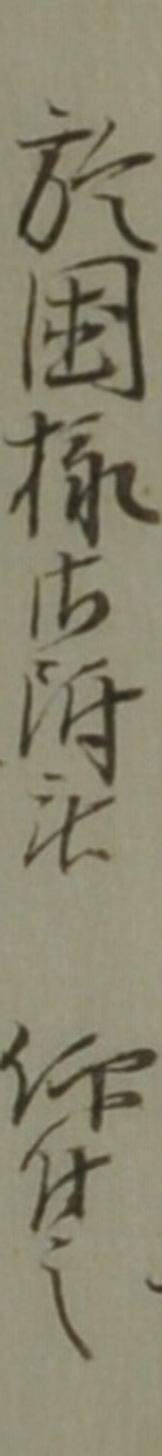於◻︎様御附被仰付之
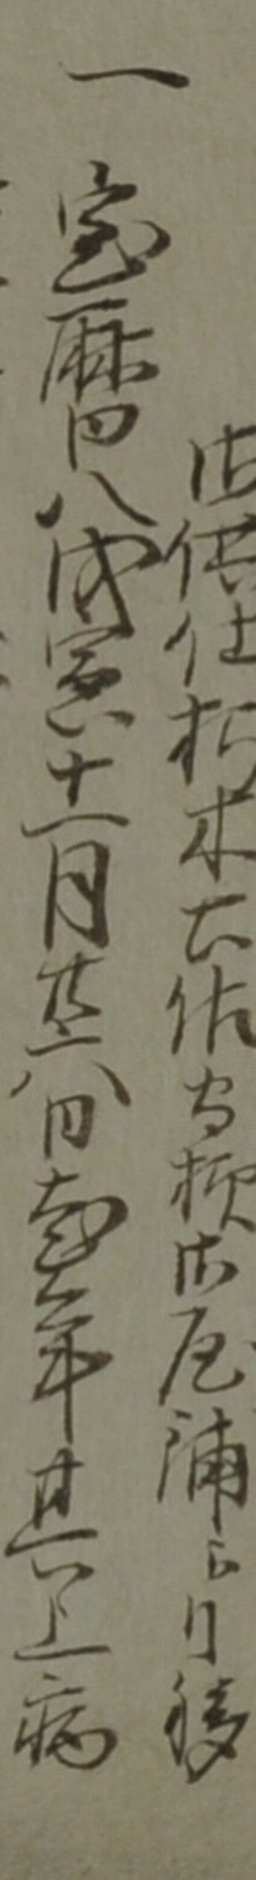一宝暦八戊寅十一月廿六日老年其上病
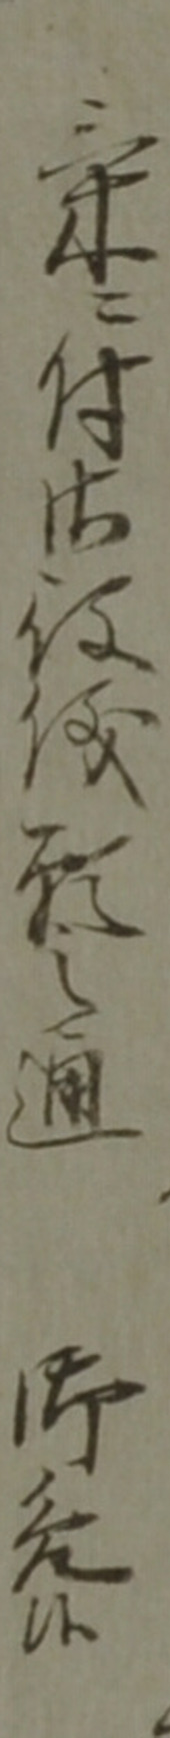気ニ付御役儀願之通御免候
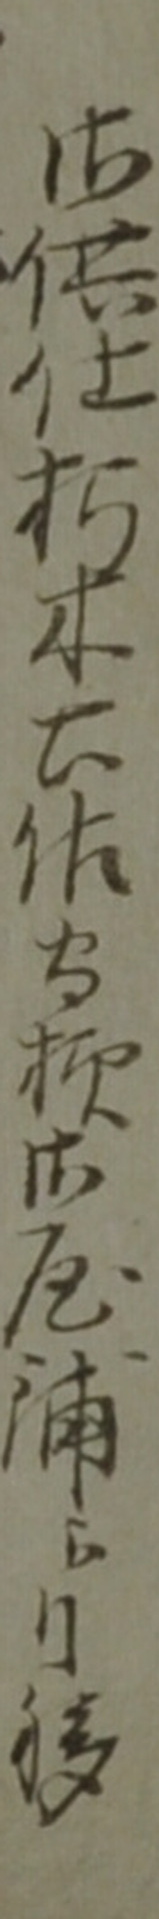御供仕朽木土佐守様御屋鋪江引移
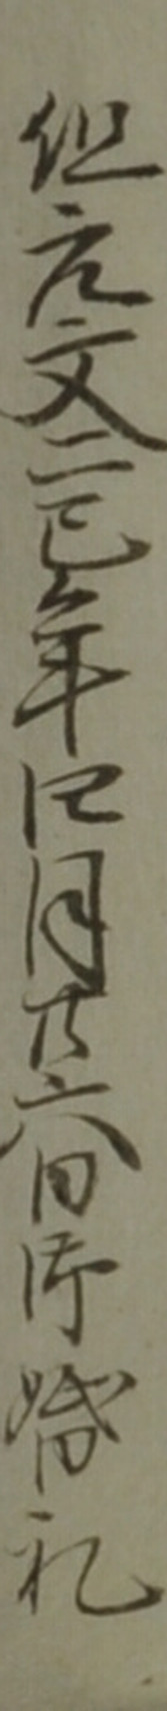但元文二巳年四月廿六日御婚礼
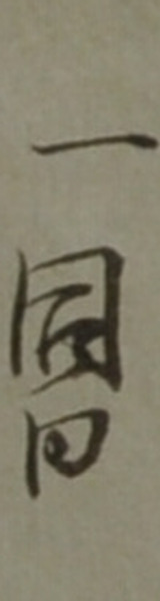一同日
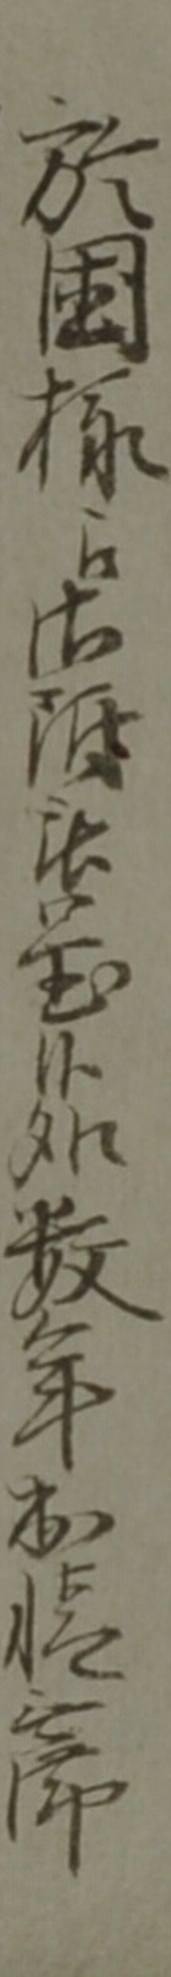於◻︎様江御附被置候処数年出精無滞
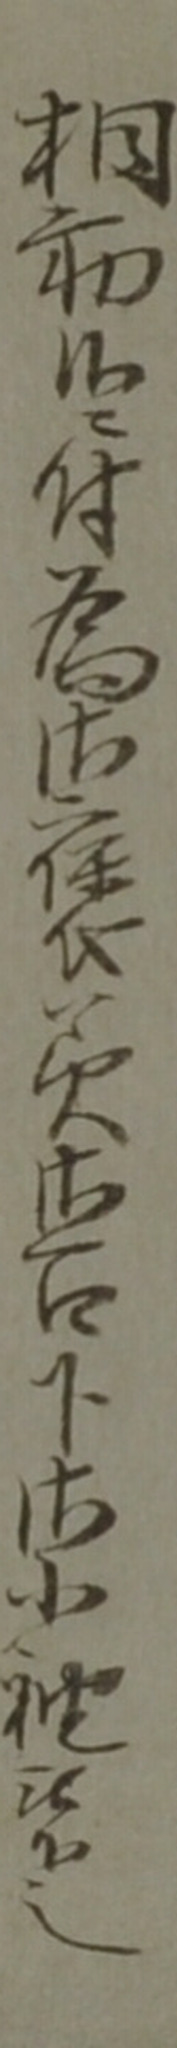相勤候ニ付為御褒美御召下御小袖被下之
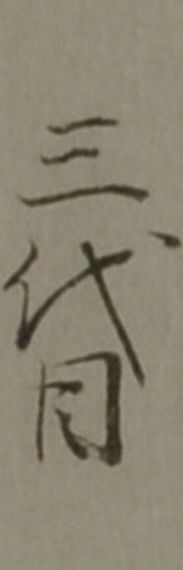三代目
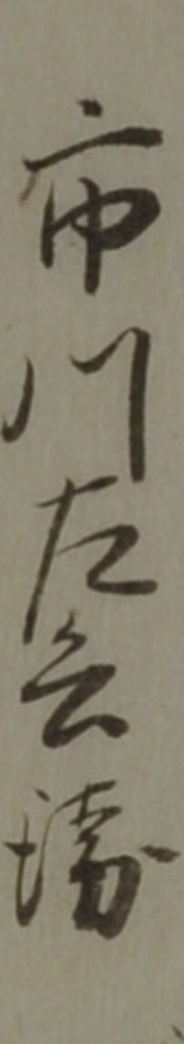市川左兵衛
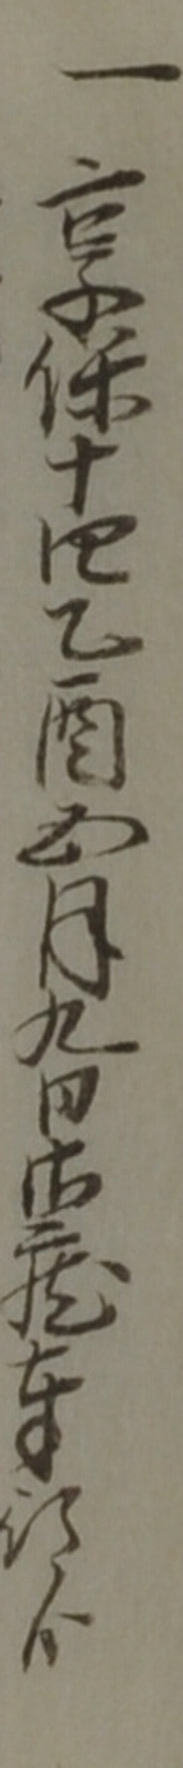一享保十四乙酉五月九日御蔵奉行ゟ
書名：諸御役代々録（六）
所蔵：伊那市立高遠町図書館・合同会社AMANE
